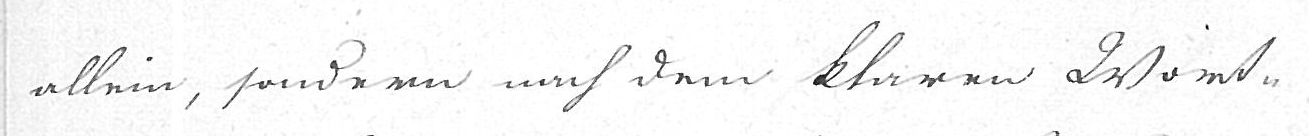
allein, sondern nach dem klaren Wort-
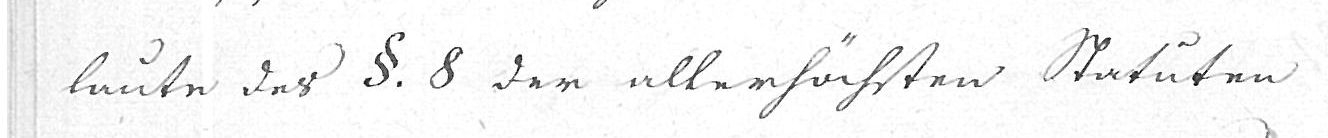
laute des § 8 der allerhöchsten Statuten
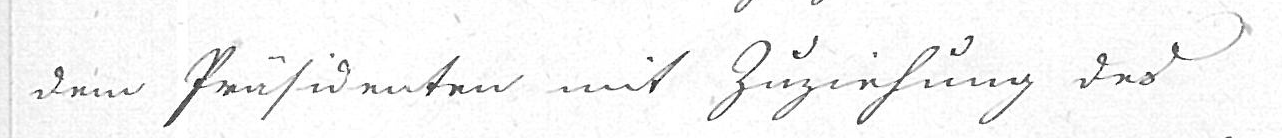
dem Präsidenten mit Zuziehung des
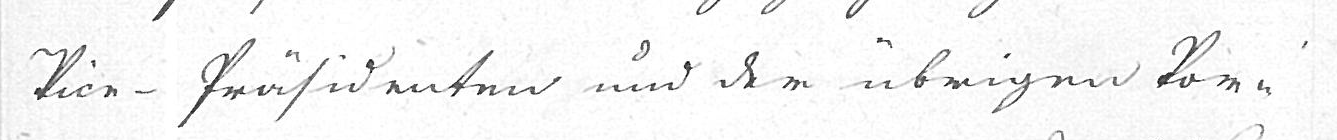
Vice-Präsidenten und der übrigen Vor-
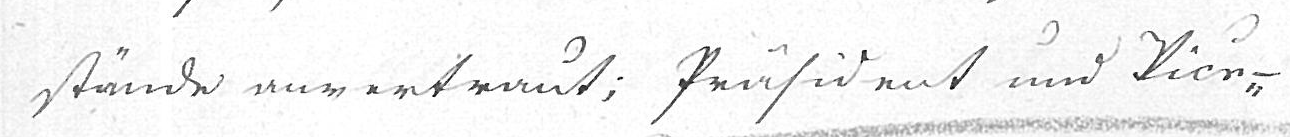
stände anvertraut; Präsident und Vice-
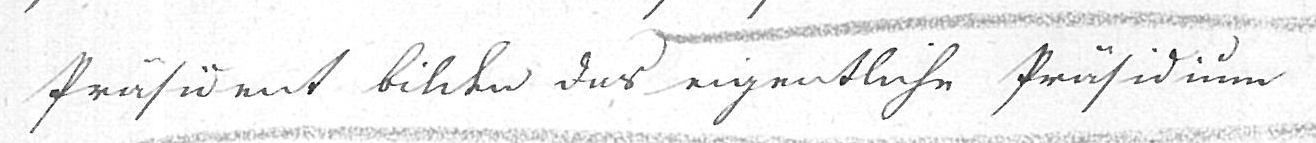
Präsident bilden das eigentlich Präsidium
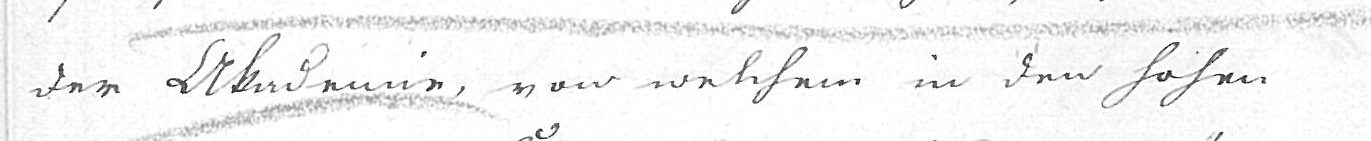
der Akademie, vor welchem in den hohen
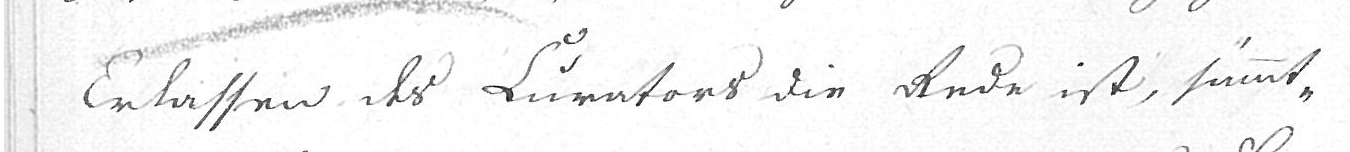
Erlassen des Curators die Rede ist, sämmt-
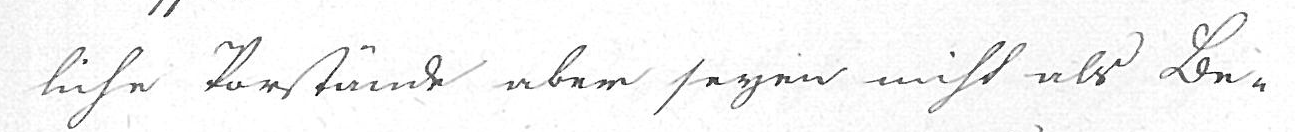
liche Vorstände aber seyen nicht als Be-
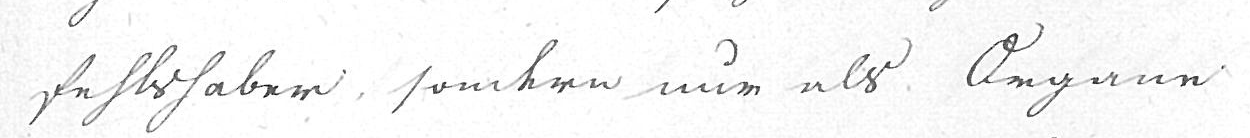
fehlshaber, sondern nur als Organe
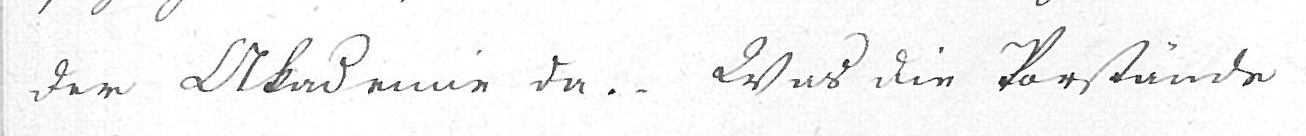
der Akademie da. Was die Vorstände
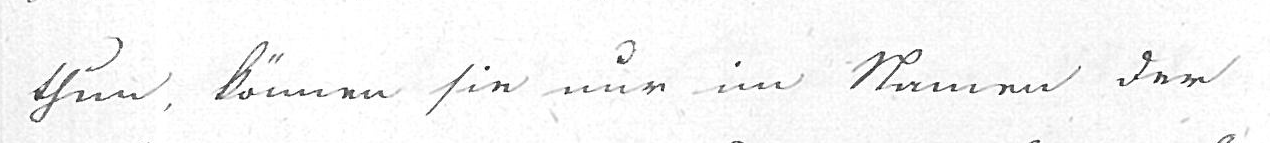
thun, können sie nur im Namen der
